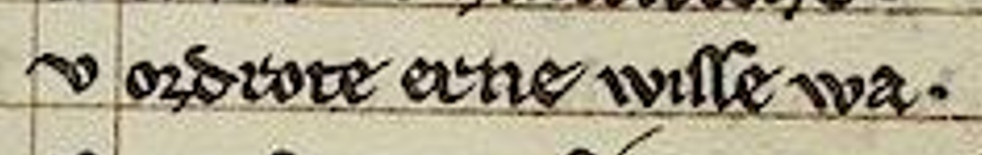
Vordrote erne wiſſe wa.
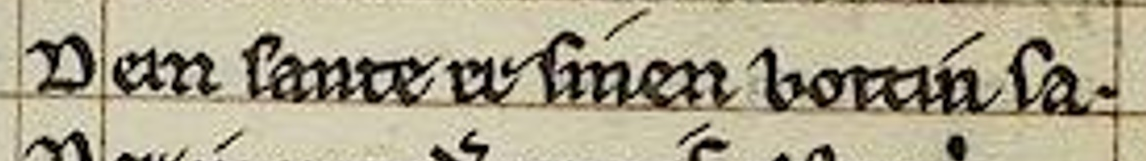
Dem ſante er ſinen bottin ſa.
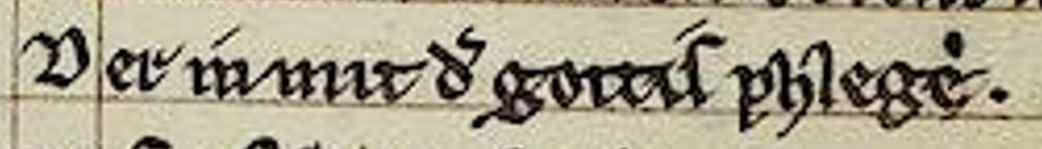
Der in mit d(er) gottiſ phlege.
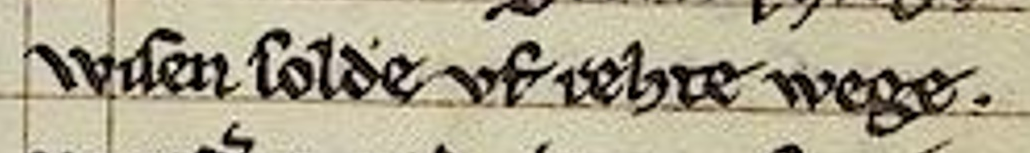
Wiſen ſolde vf rehte wege.
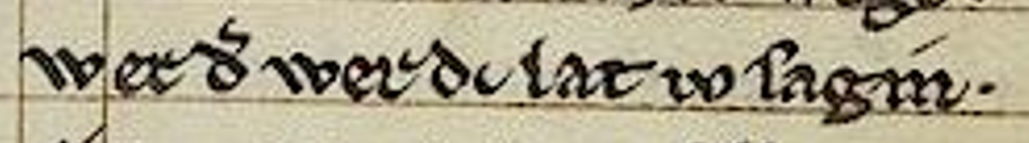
Wer d(er) wer d(az) lat iv ſagin.
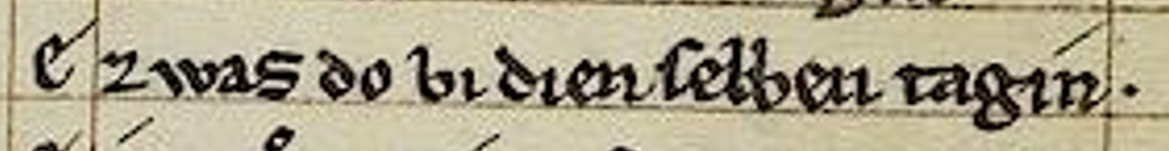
Ez was do bi dien ſelben tagin.
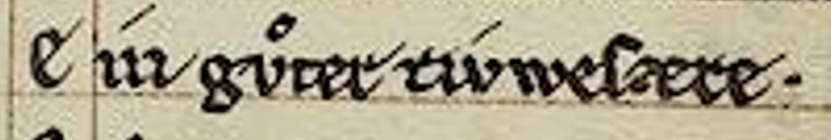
Ein gv°oter rivweſ[ae]re.
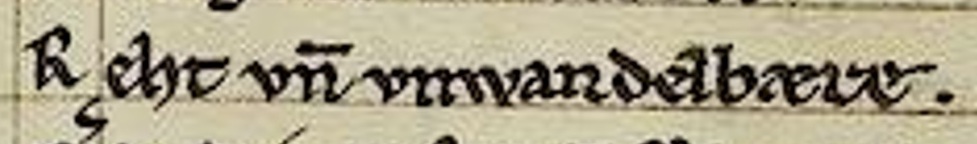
Reht vn(d) vnwandelb[ae]re.
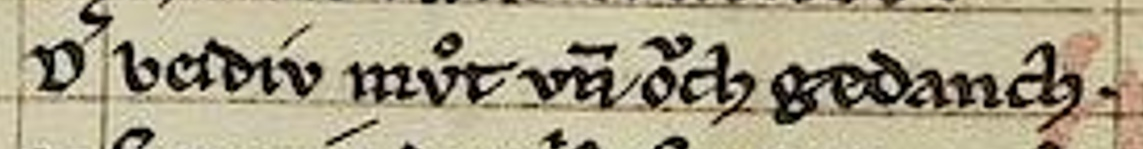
D(er) beidiv mv°ot vn(d) o°vch gedanch.
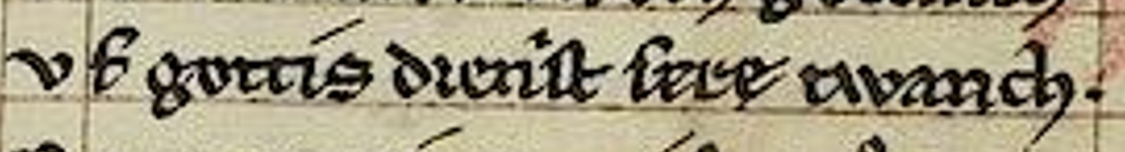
Vf gottis dienſt ſere twanch.
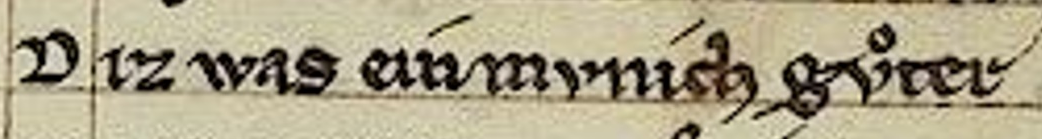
Diz was ein mvnich gv°oter
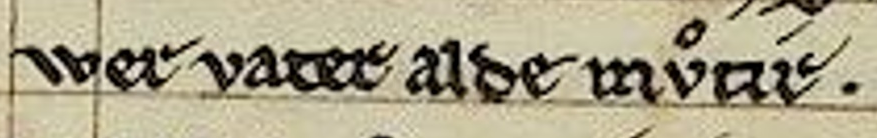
Wer vater alde mv°otir.
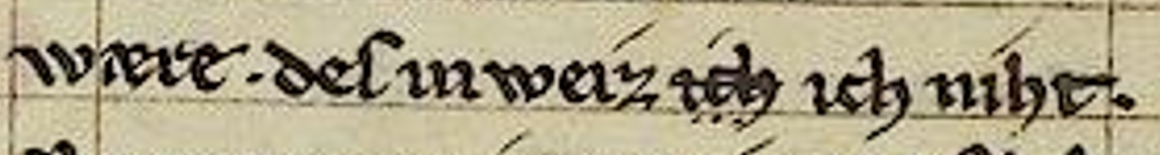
w[ae]re. deſ inweiz ich ich niht.
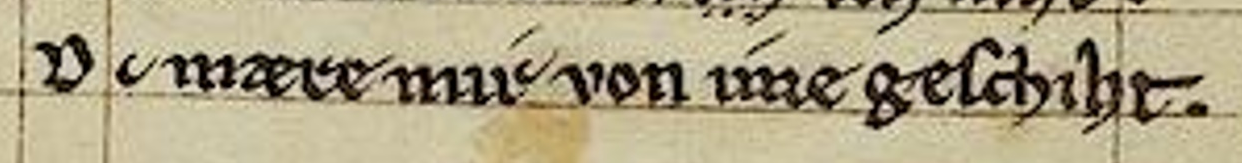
D(az) m[ae]re mir von ime geſchiht.
